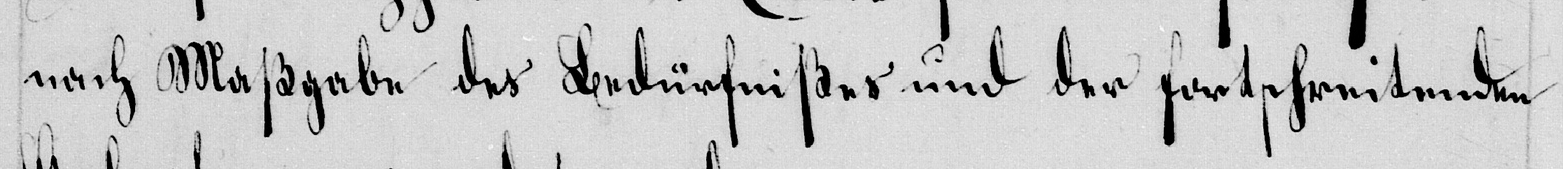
nach Maßgabe des Bedürfnißes und der fortschreitenden
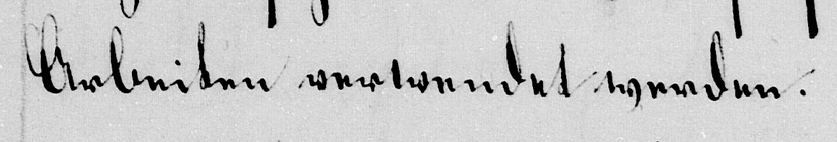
Arbeiten verwendet werden.
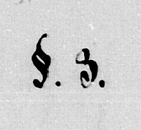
§. 3.
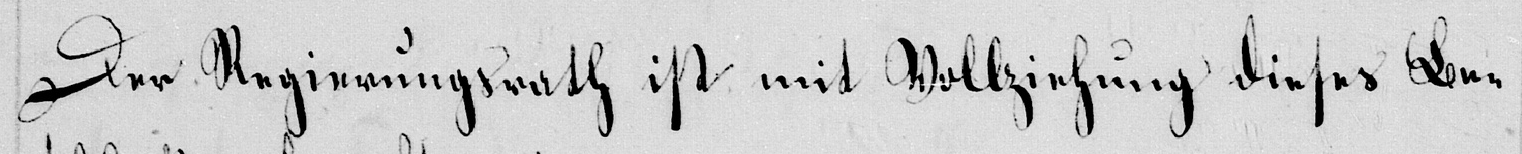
Der Regierungsrath ist mit Vollziehung dieses Be¬
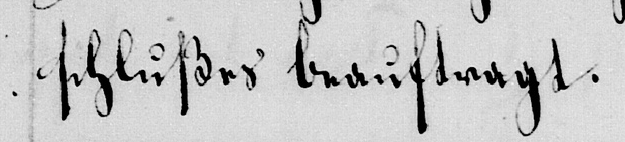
schlußes beauftragt.
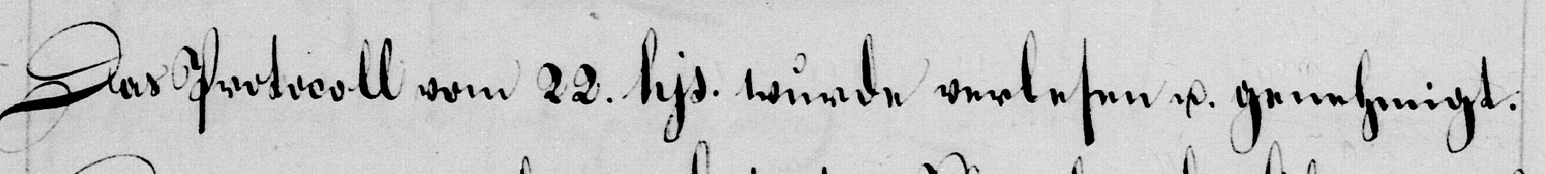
Das Protocoll vom 22. hjs. wurde verlesen u. genehmigt.
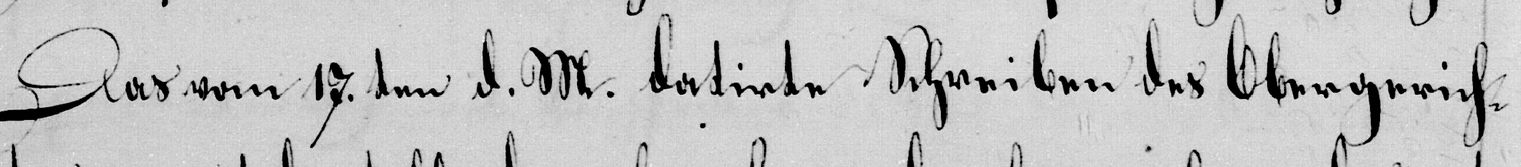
Das vom 17.ten d. M. datirte Schreiben des Obergerich¬
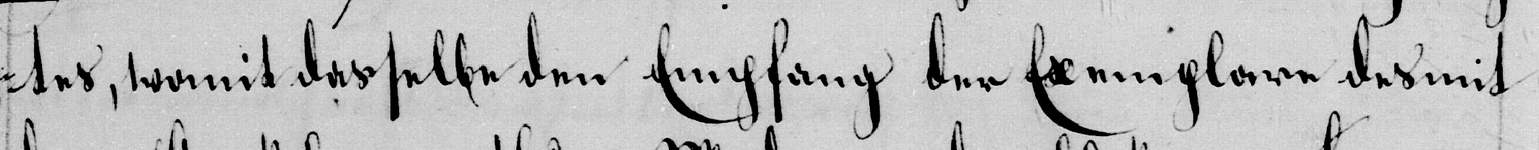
tes, womit dasselbe den Empfang der Exemplare des mit
